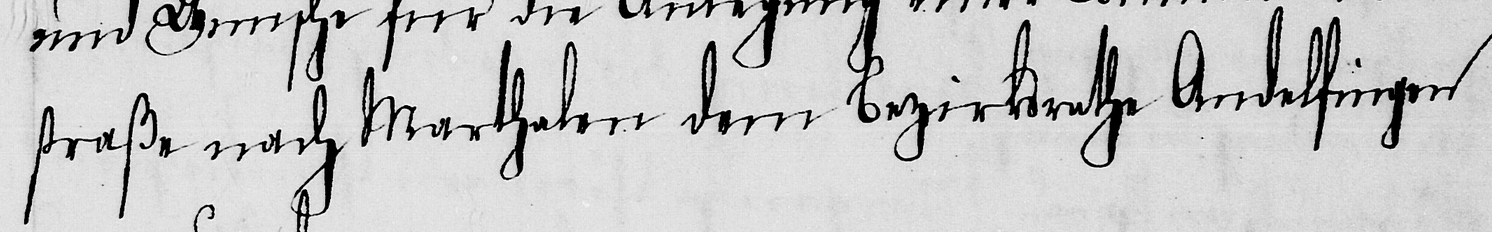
straße nach Marthalen dem Bezirksrathe Andelfingen
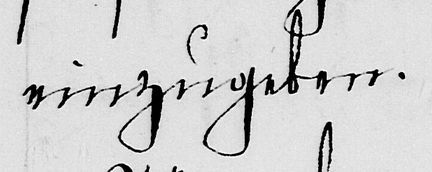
einzugeben.
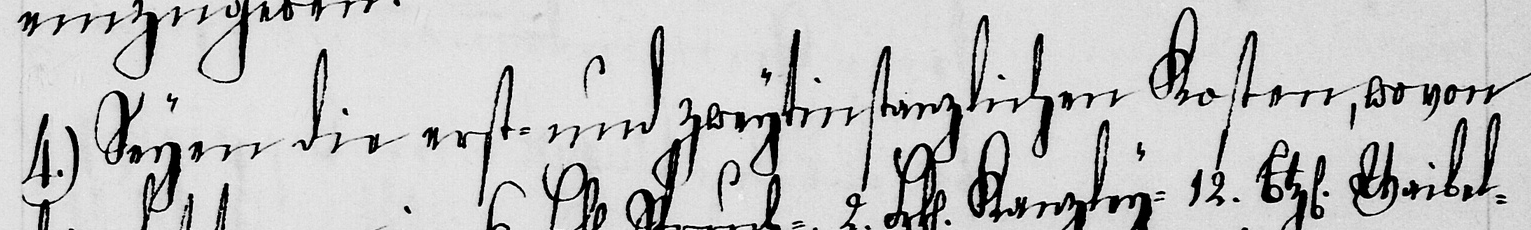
4.) Seyen die erst- und zweytinstanzlichen Kosten, wovon
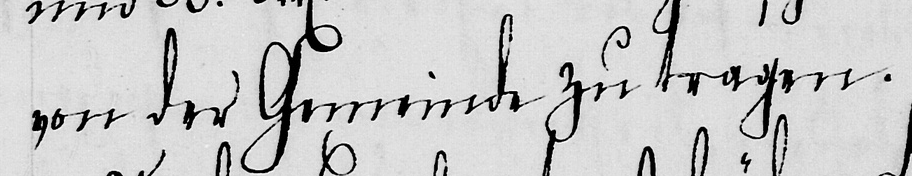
von der Gemeinde zu tragen.
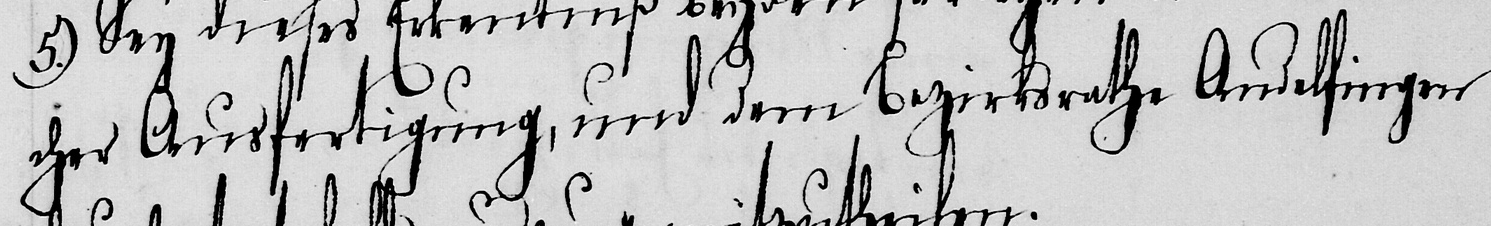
cher Ausfertigung, und dem Bezirksrathe Andelfingen
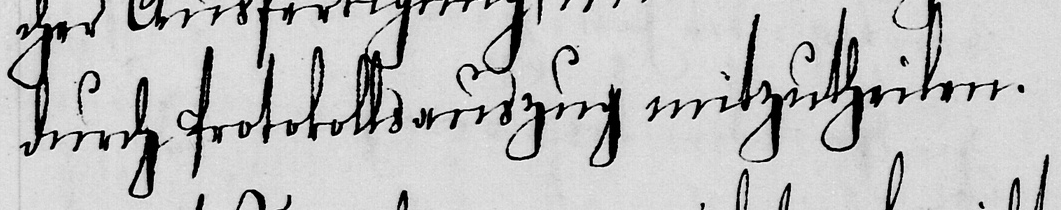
durch Protokollsauszug mitzutheilen.
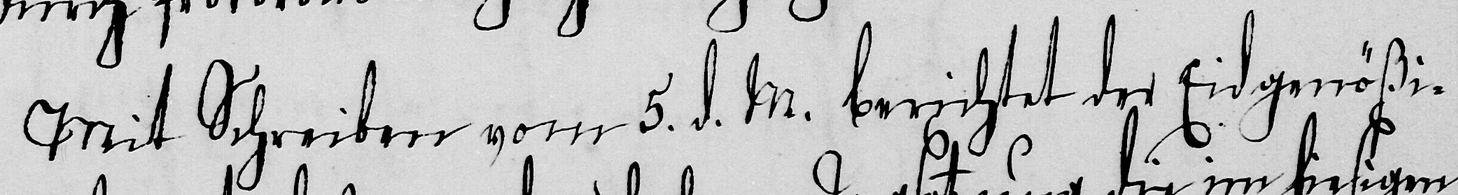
Mit Schreiben vom 5. d. M. berichtet der Eidgenößis¬
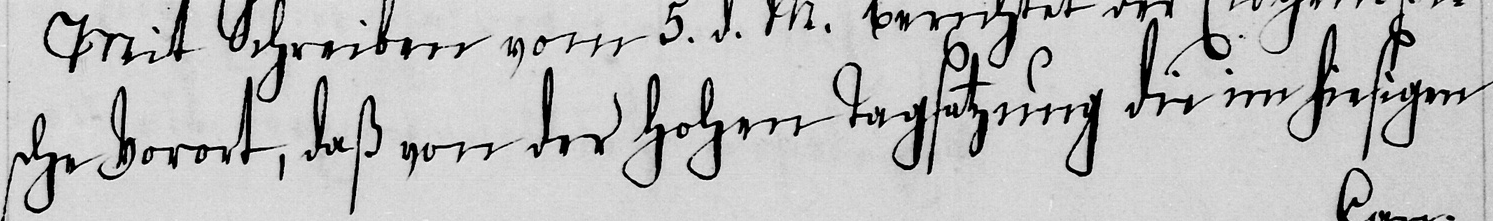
che Vorort, daß von der Hohen Tagsatzung die im hiesigen
